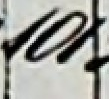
101
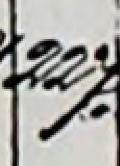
227
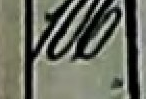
106
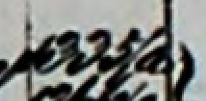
1335/a
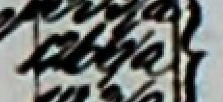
1266/a
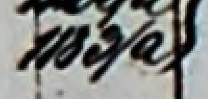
1183/a
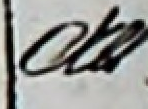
Alt
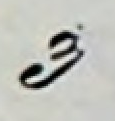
3
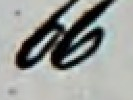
66
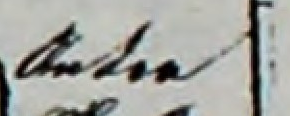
An der
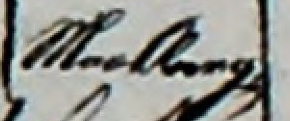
Moosberg
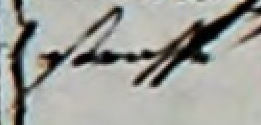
st?asse
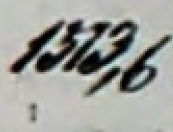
1513,6
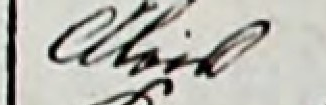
Alois
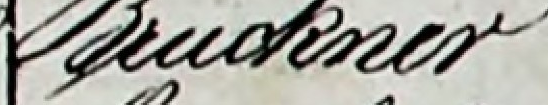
Bruckner
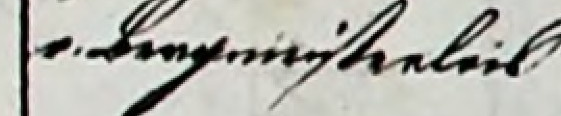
v. Bergmeisterleis
